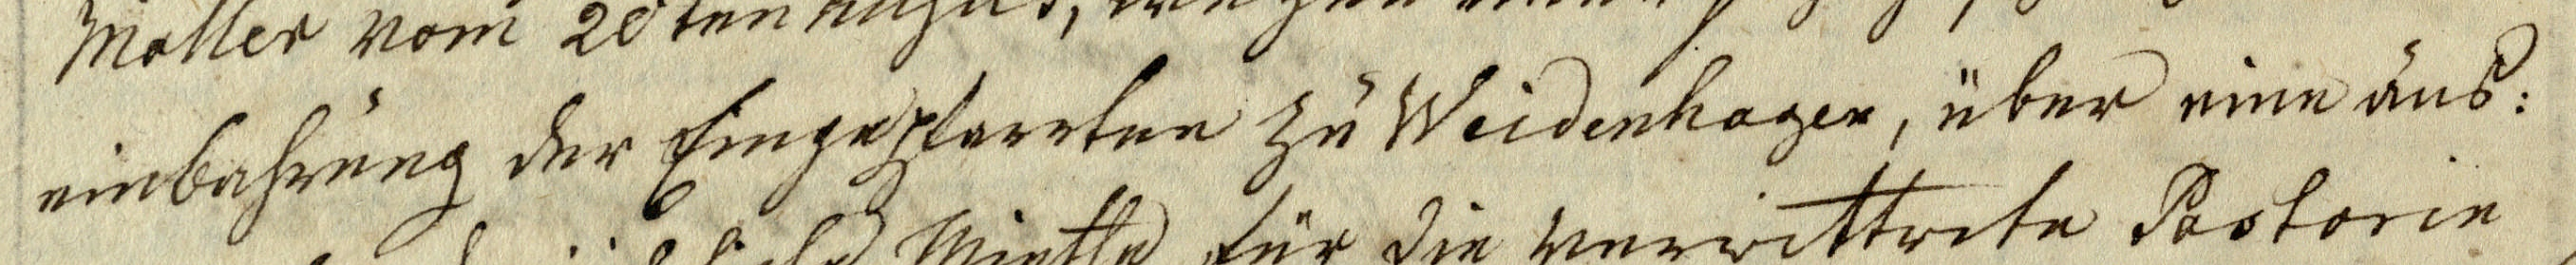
einbahrung der Eingepfarrten zu Weidenhagen, über eine aus¬
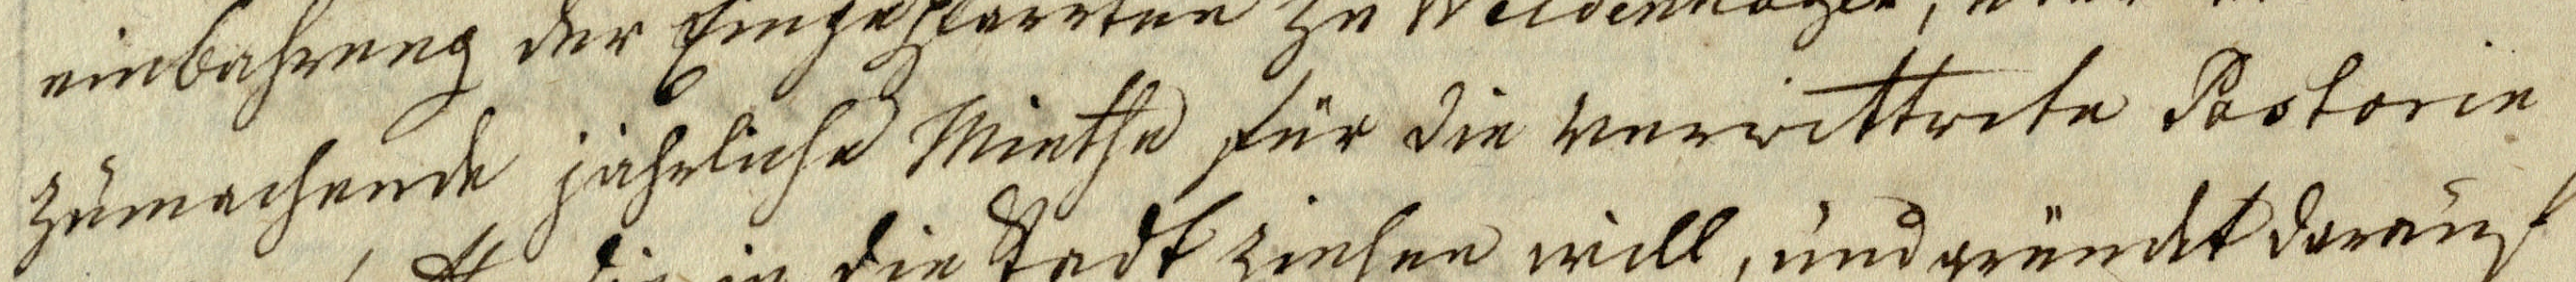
zumachende jährliche Miethe für die verwittwete Pastorin
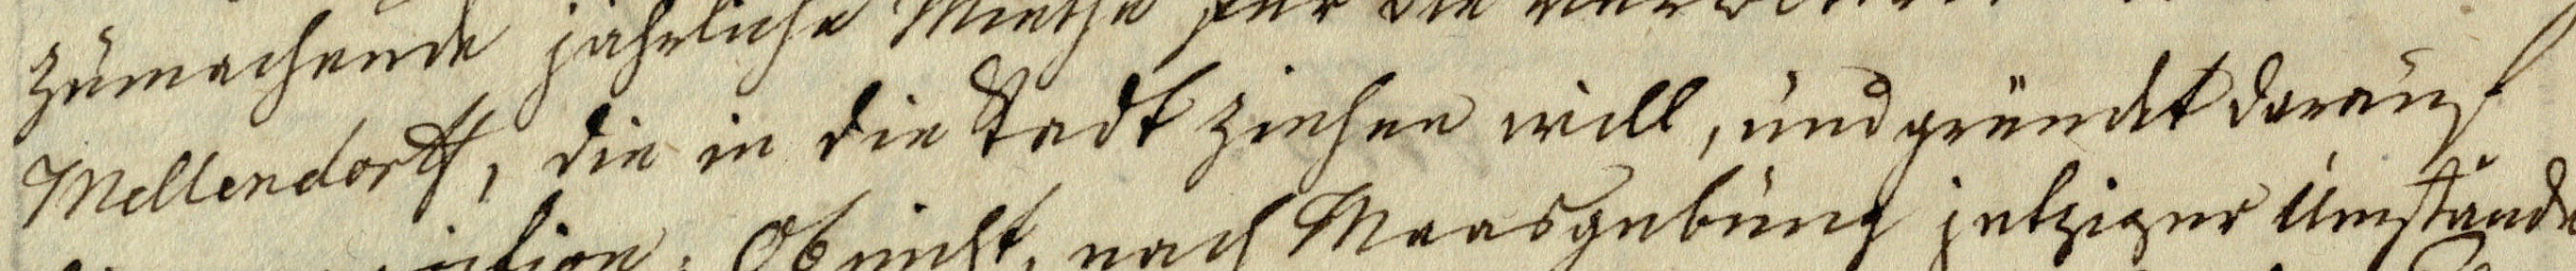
Mellendorff, die in die Stadt ziehen will, und gründet darauf
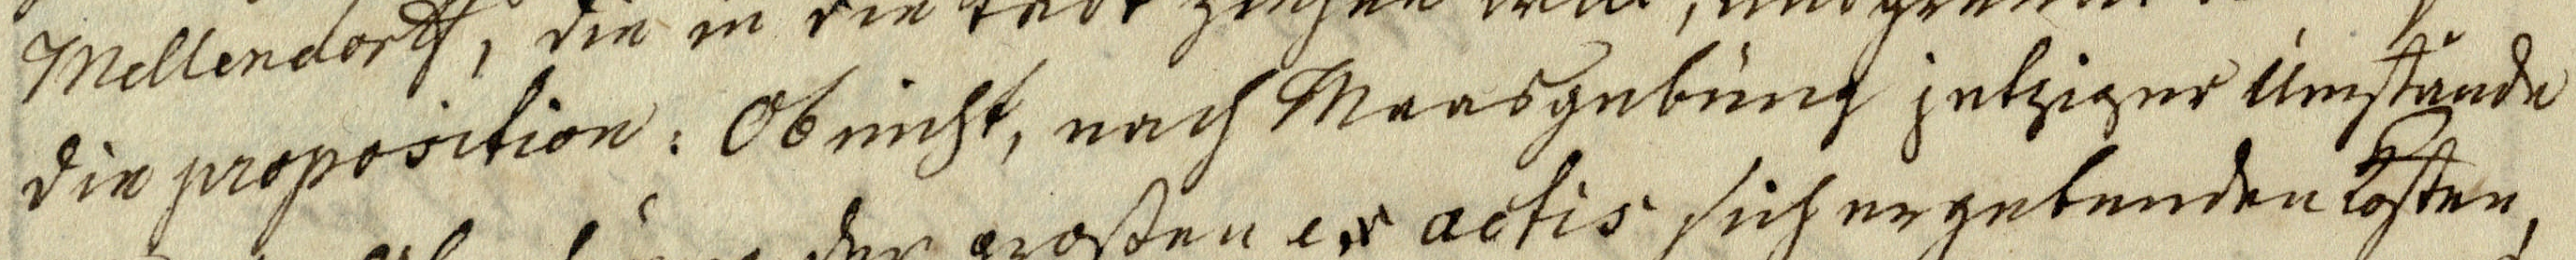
die proposition: Ob nicht nach Maasgebung jetziger Umstände
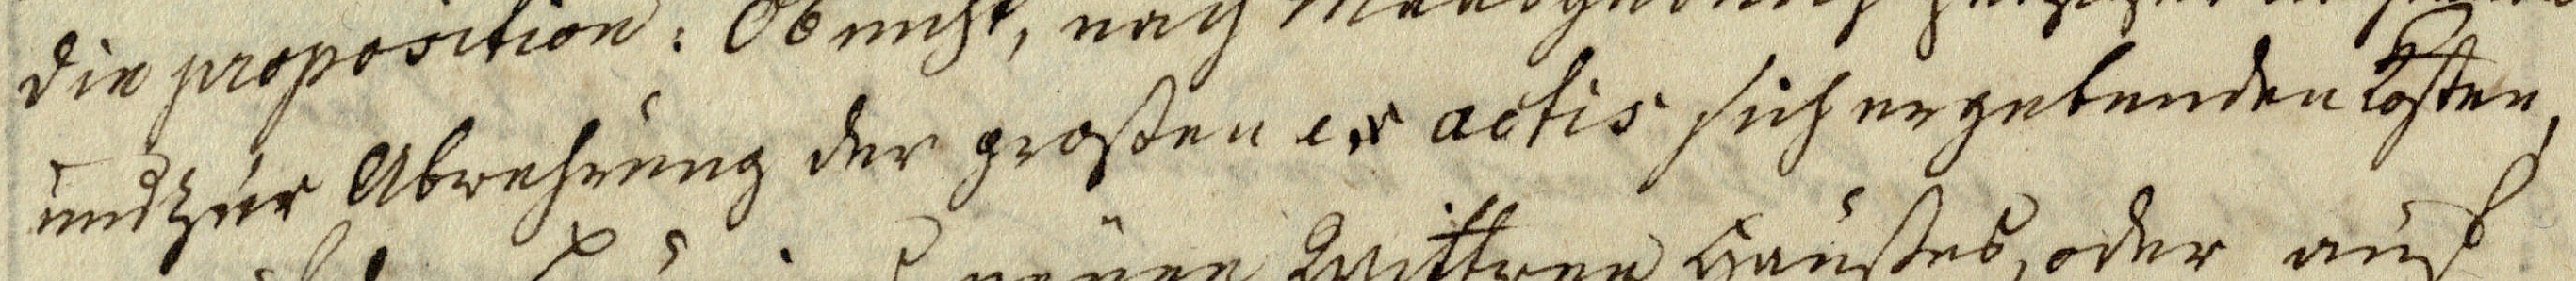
und zur Abwehrung der großen ex actis sich ergebenden Kosten,
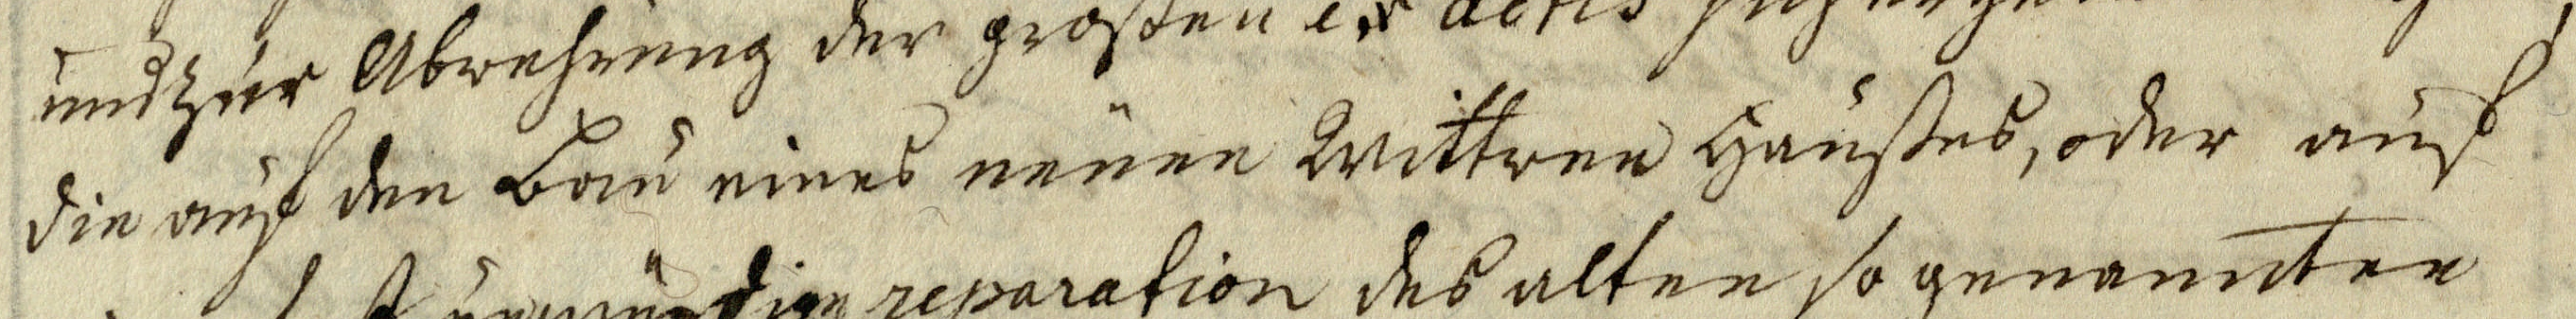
die auf den Bau eines neuen Wittwen Haußes, oder auf
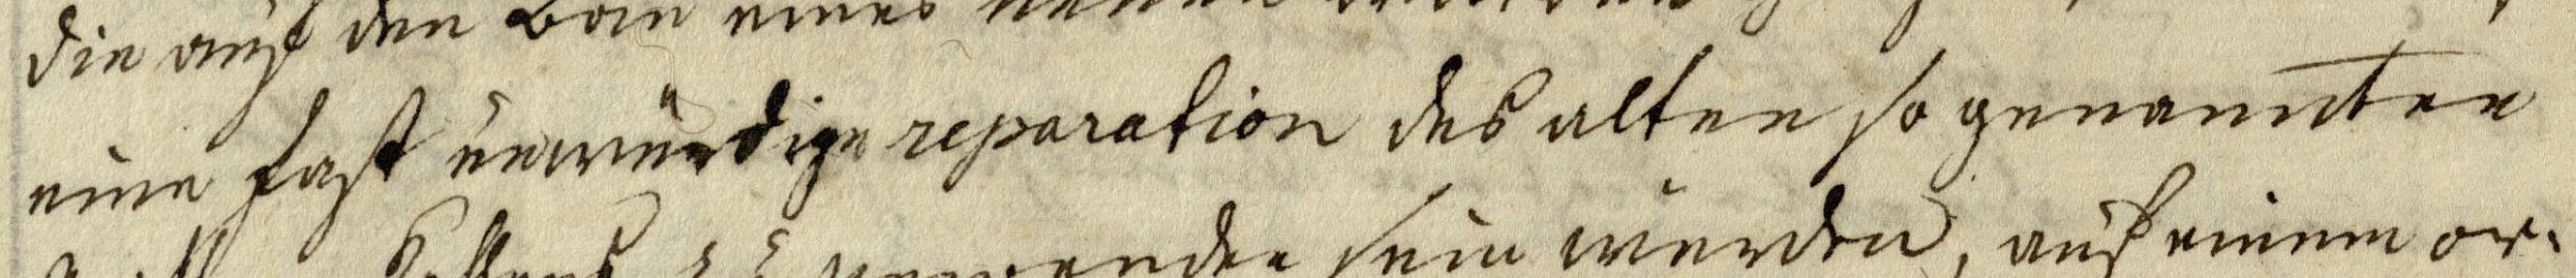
eine fast unwürdige reparation des alten so genannten
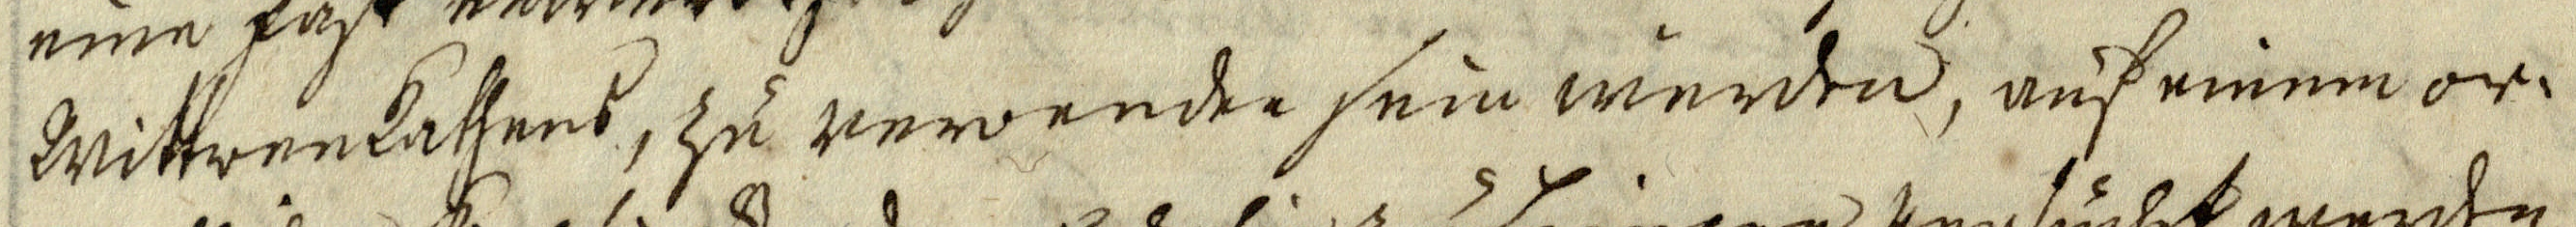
Wittwen Kathens, zu verwenden sein würden, auf einem or¬
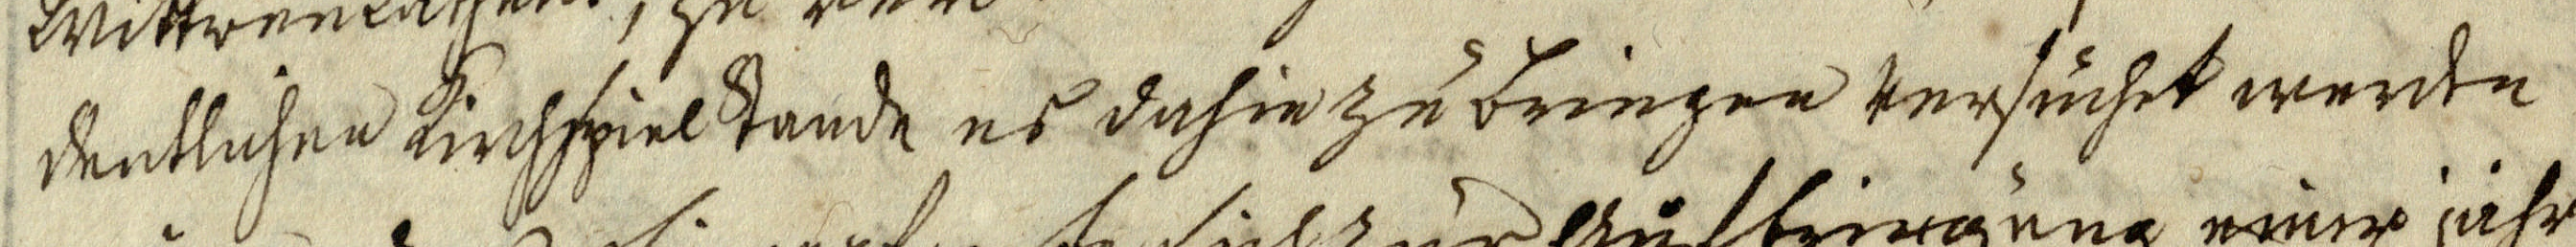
dentlichen Kirchspiel Stande es dahin zu bringen versuchet werden
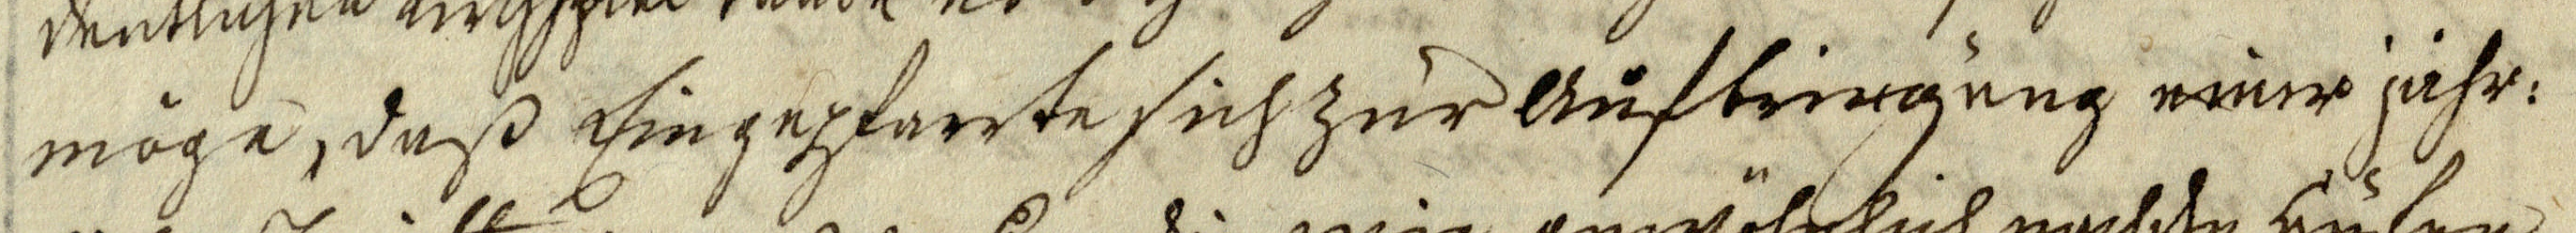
möge, daß Eingepfarrte sich zur Aufbringung einer jähr¬
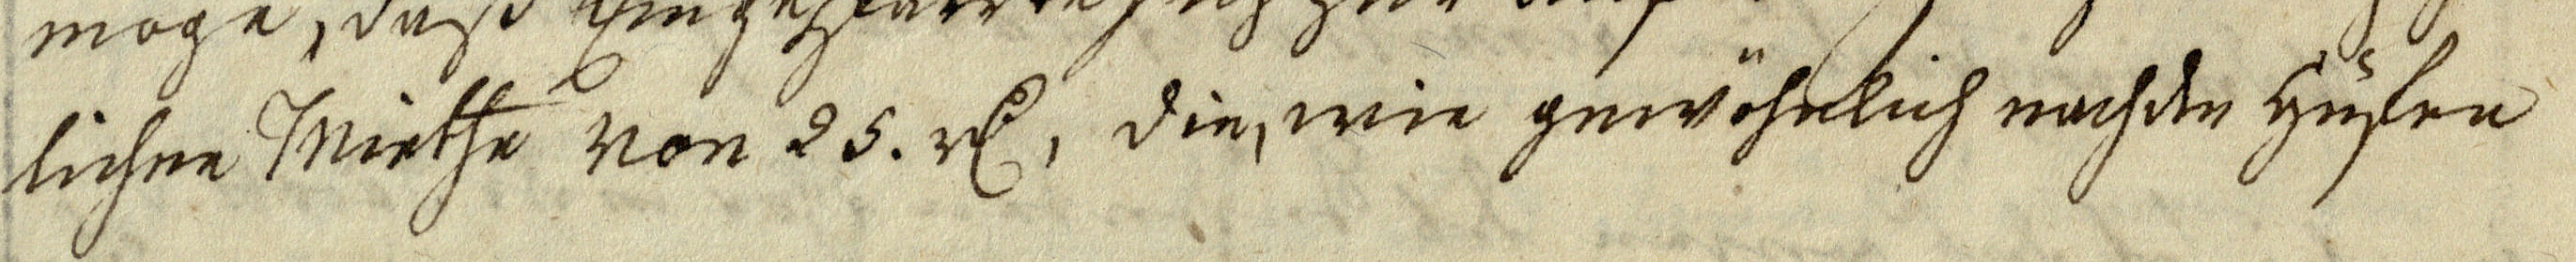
lichen Miethe von 25. r. die, wie gewöhnlich nach den Hufen
